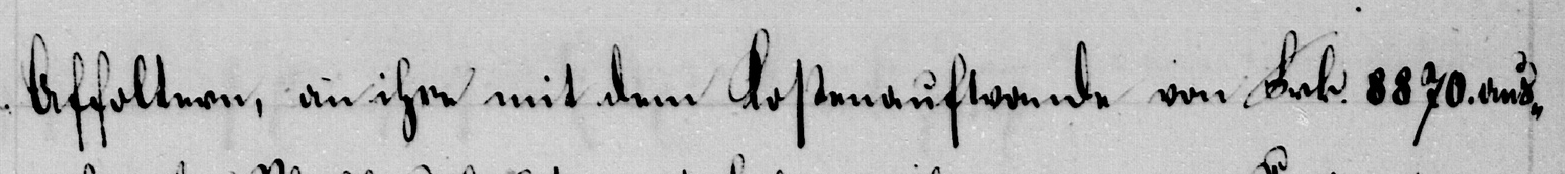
Affoltern, an ihre mit dem Kostenaufwande von Frk. 8870. aus¬
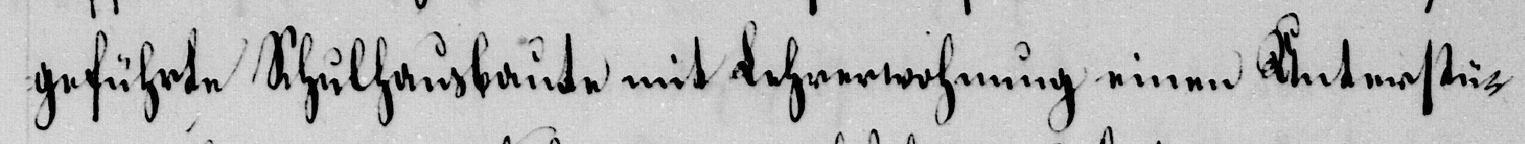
geführte Schulhausbaute mit Lehrerwohnung einen Unterstü¬
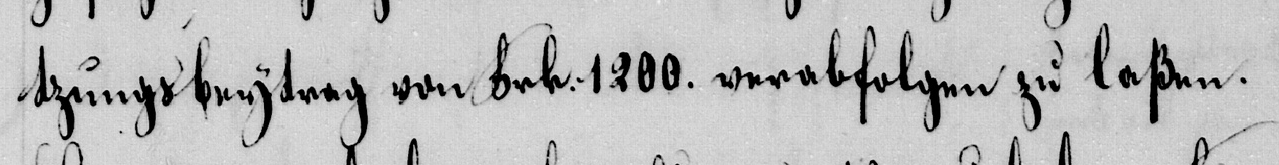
tzungsbeytrag von Frk. 1200. verabfolgen zu laßen.
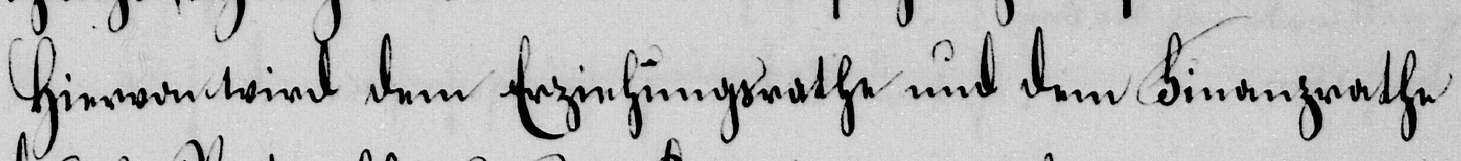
Hiervon wird dem Erziehungsrathe und dem Finanzrathe
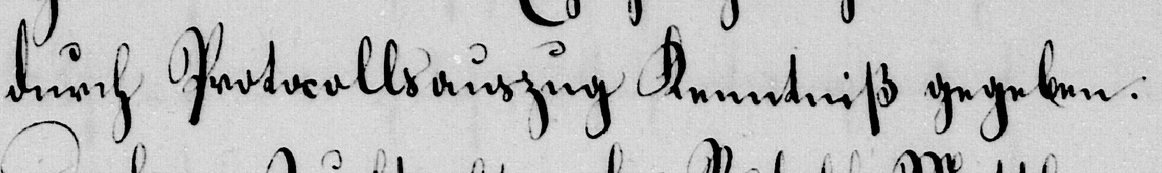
durch Protokollsauszug Kenntniß gegeben.
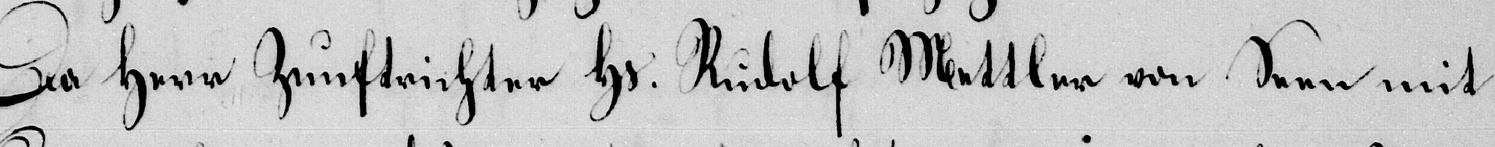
Da Herr Zunftrichter Hs. Rudolf Mettler von Seen mit
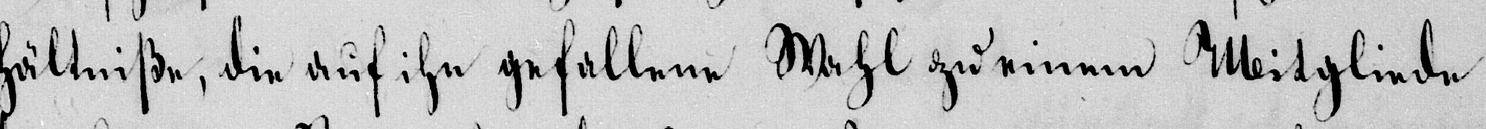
hältniße, die auf ihn gefallene Wahl zu einem Mitgliede
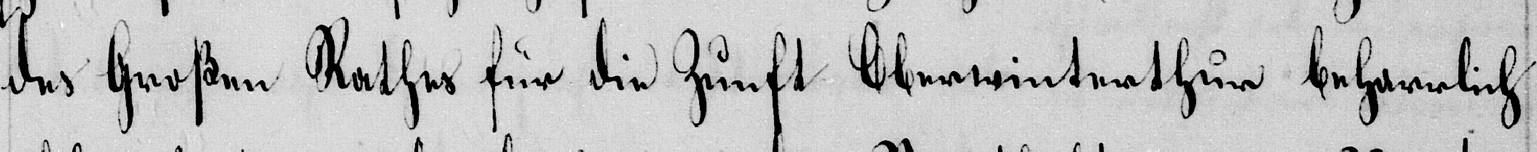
des Großen Rathes für die Zunft Oberwinterthur beharrlich
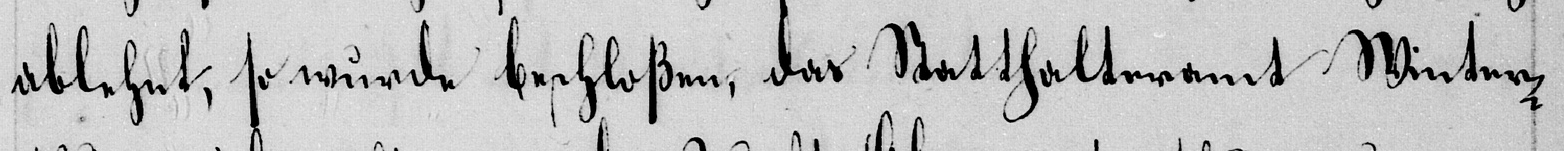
ablehnt, so wurde beschloßen, das Statthalteramt Winter¬
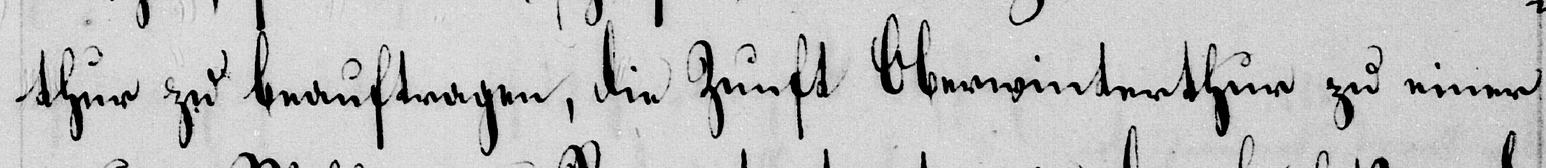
thur zu beauftragen, die Zunft Oberwinterthur zu einer
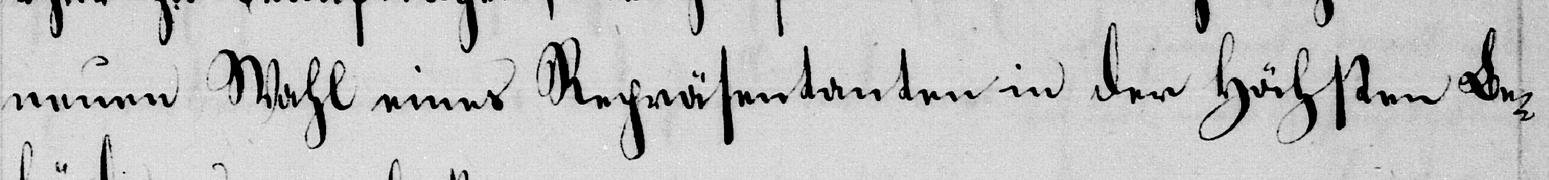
neuen Wahl eines Repräsentanten in der Höchsten Be¬
